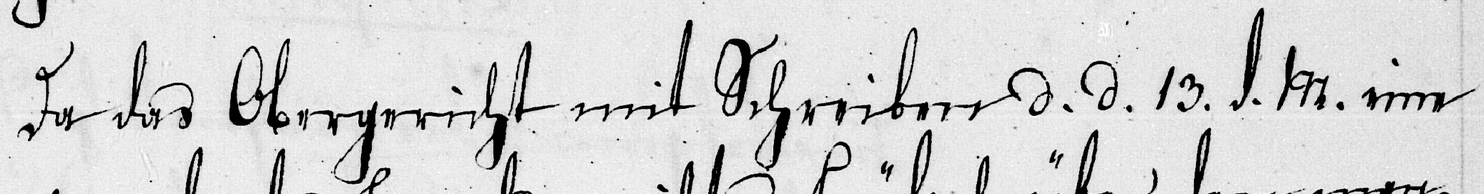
Da das Obergericht mit Schreiben d. d. 13. d. M. eine
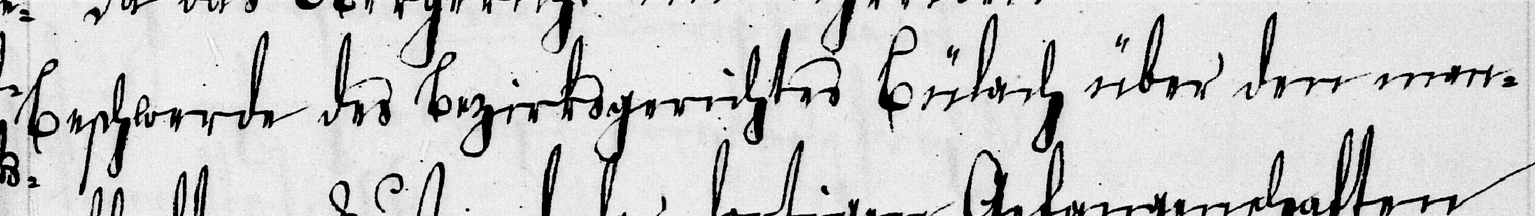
Beschwerde des Bezirksgerichtes Bülach über den man¬
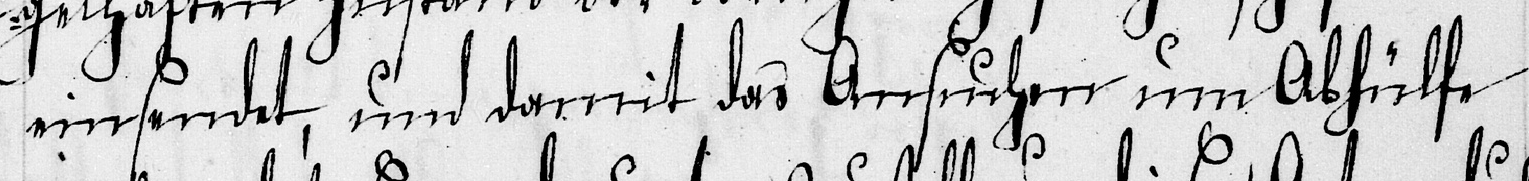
einsendet, und damit das Ansuchen um Abhülfe
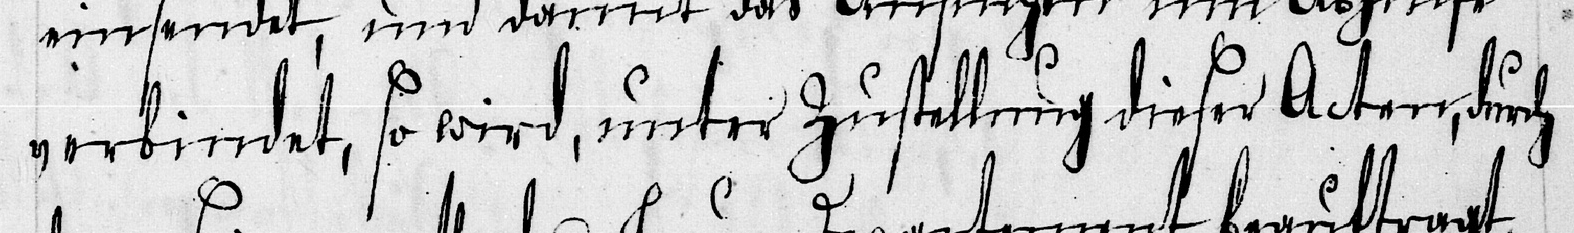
verbindet, so wird, unter Zustellung dieser Acten, durch
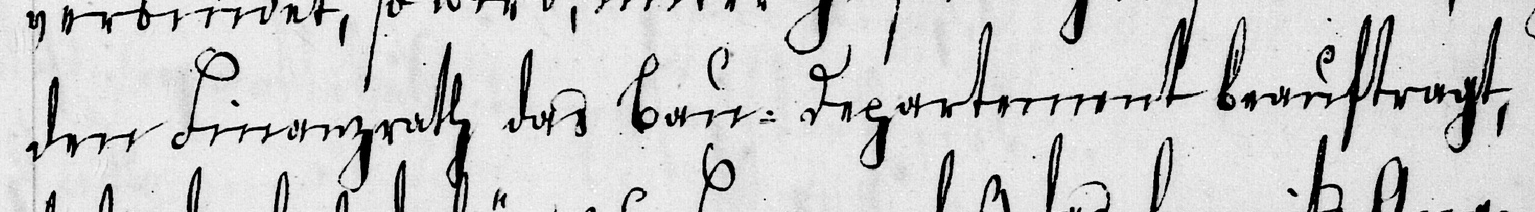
den Finanzrath das Bau-Departement beauftragt,
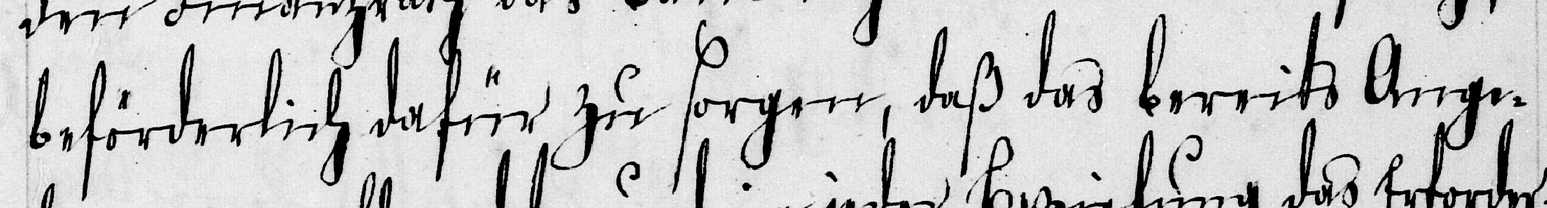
beförderlich dafür zu sorgen, daß das bereits Ange¬
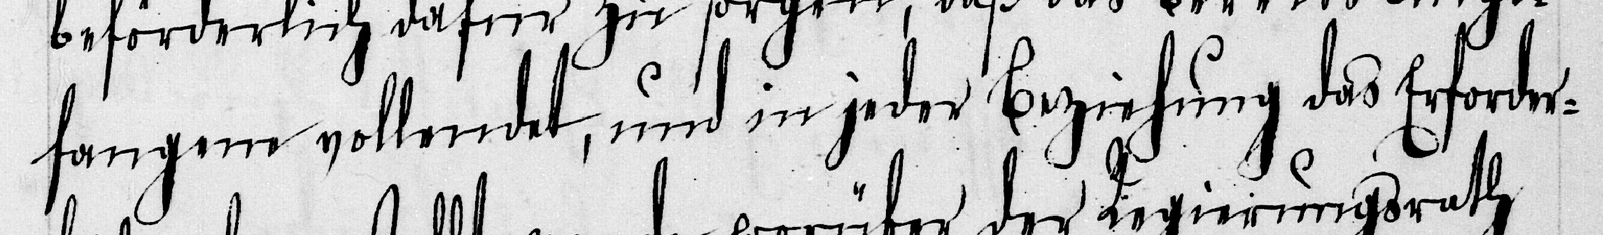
fangene vollendet, und in jeder Beziehung das Erforde¬
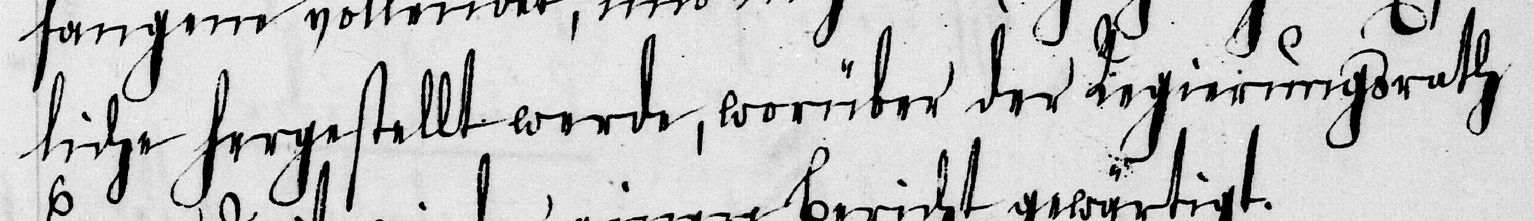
rliche hergestellt werde, worüber der Regierungsrath
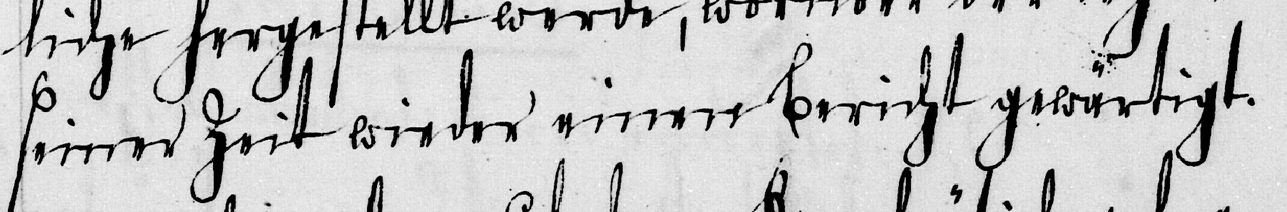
seiner Zeit wieder einen Bericht gewärtigt.
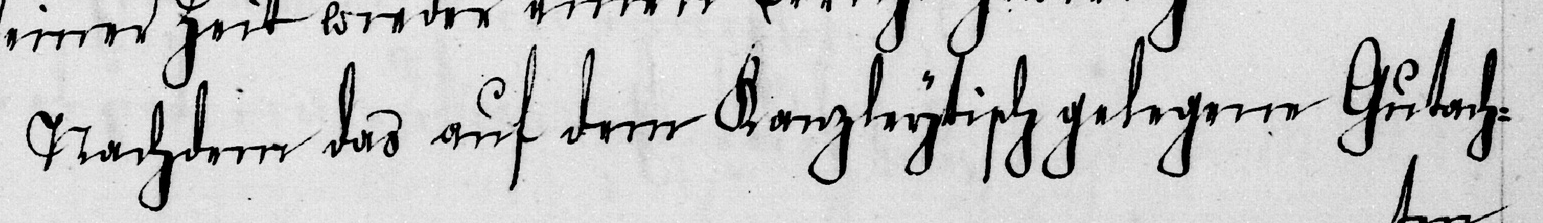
Nachdem das auf dem Kanzleytisch gelegene Gutach-
